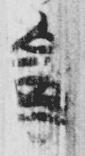命
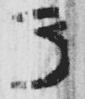乃
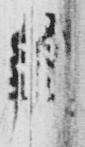執
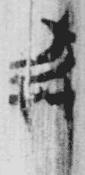兵
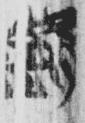欽（禁）
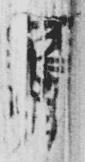○（暴）
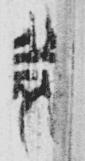羕
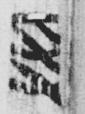○（得）
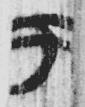于
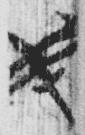民
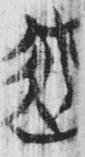述
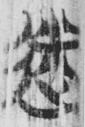迷
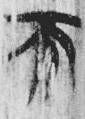而
